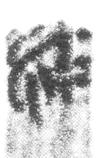結
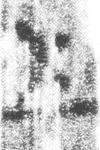之
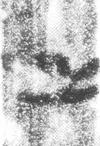心
